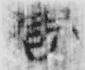周
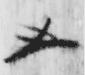之
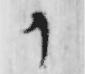人
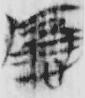應
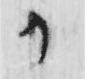人
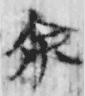余
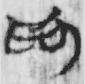爲
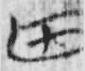甲
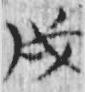戌
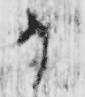人
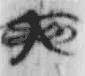寅
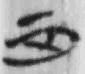正
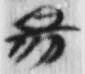昜（陽）
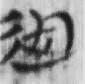○（卜）
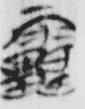雷
